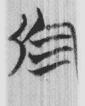於
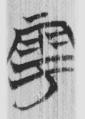𩁹
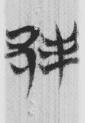邦
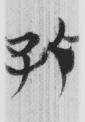孤
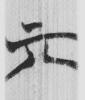亓
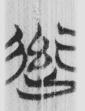{行幺止}
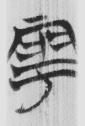𩁹
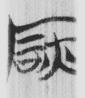庶
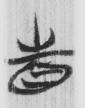眚
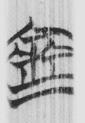齊
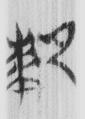{桼㔾}
